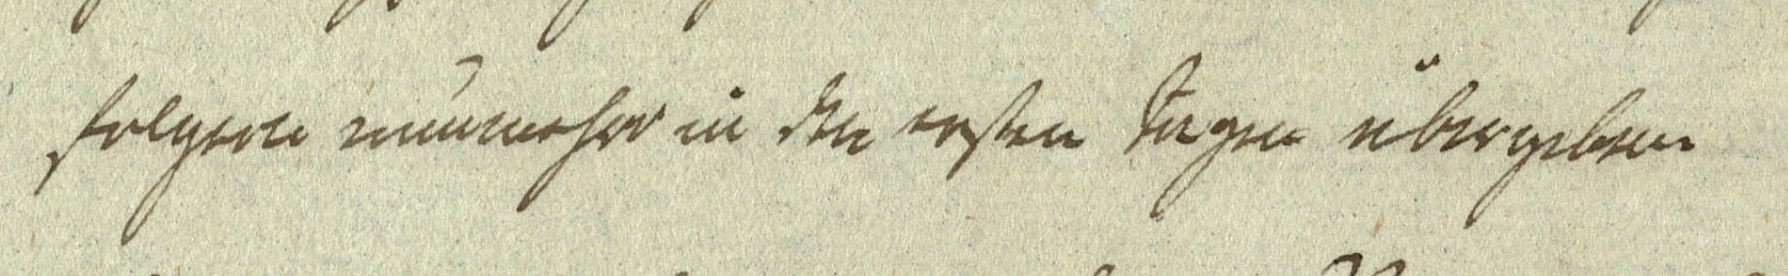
folgern nunmehro in den ersten Tagen übergeben
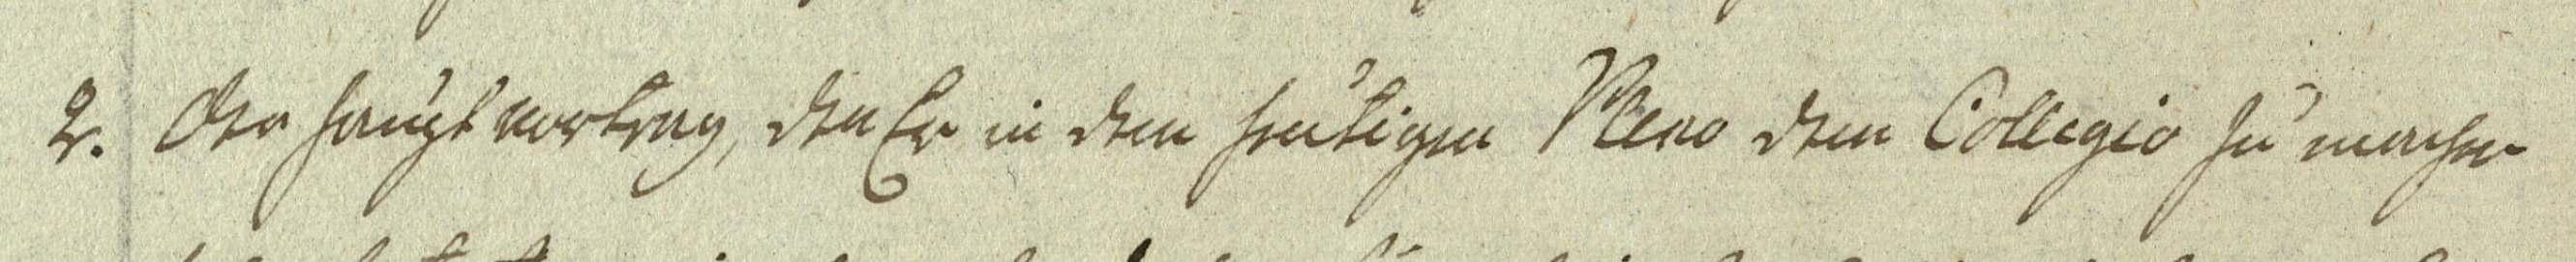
2. Der Haupt Vortrag, der in dem heutigen Pleno dem Collegio zu machen
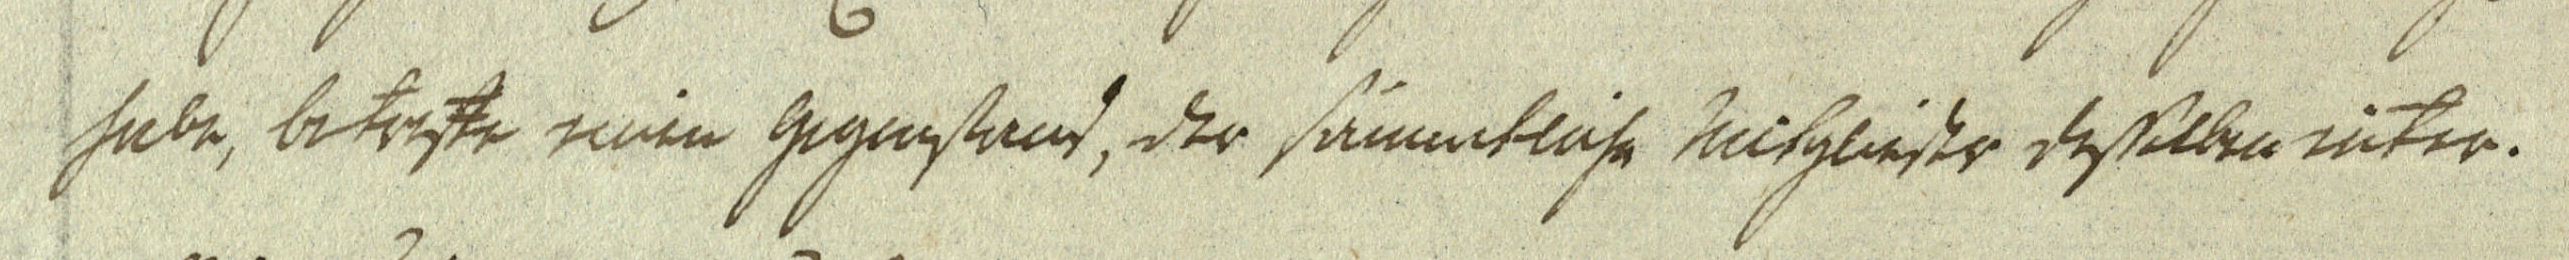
habe, betrefe einen Gegenstand, der sämmtliche Mitglieder desselben inter¬
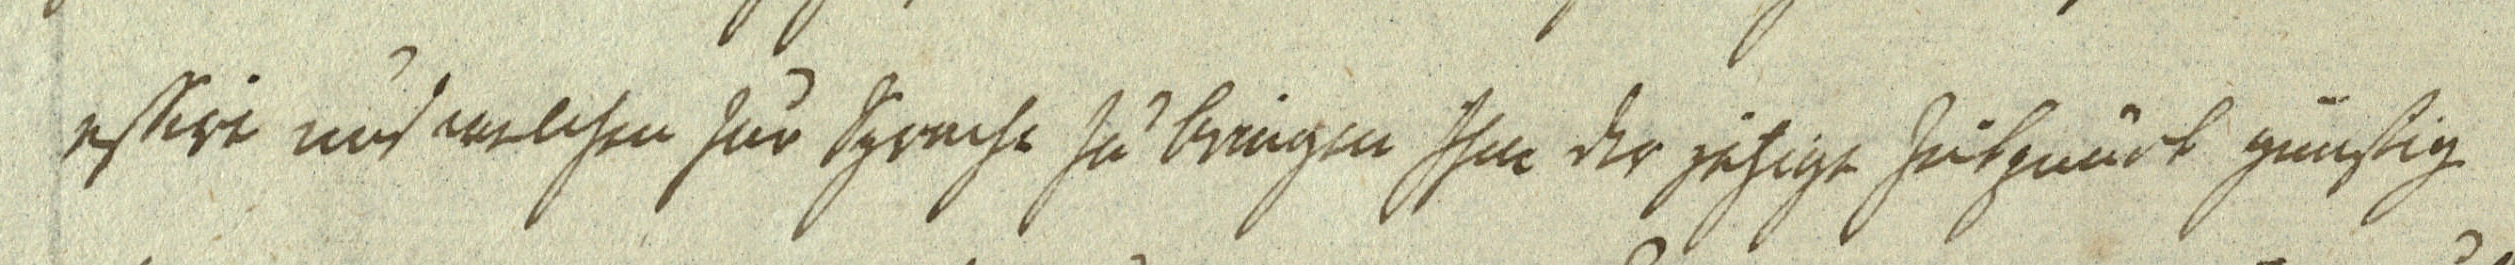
bessere und welchen zur Sprache zu bringen Ihm der jetzige Zeitpunct genug
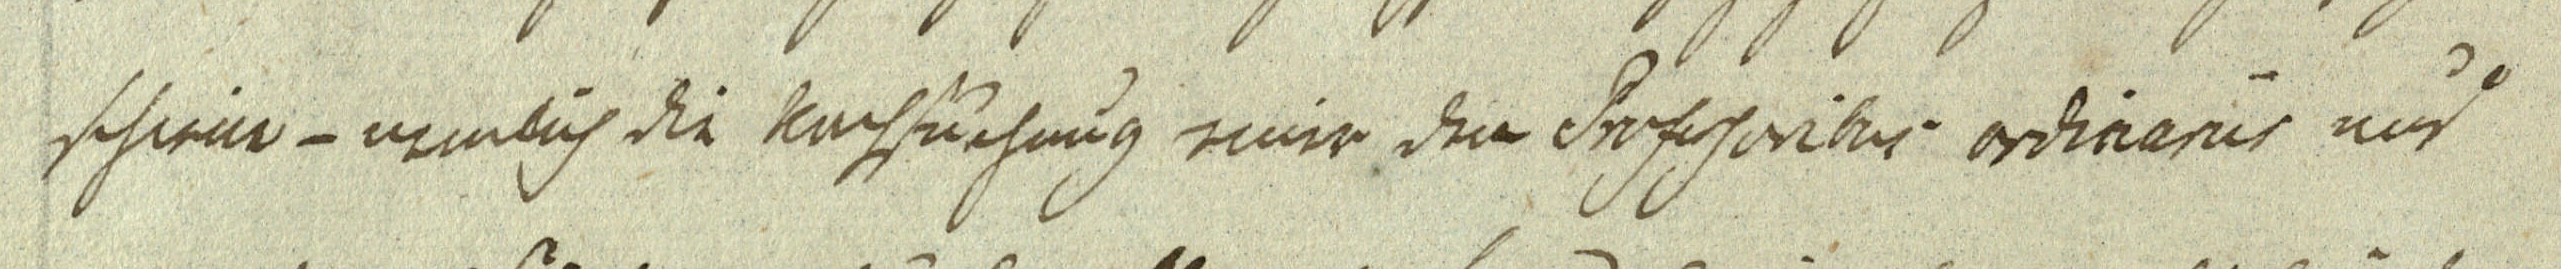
schiene nemlich die Nachsuchung einer den Professoribus ordenarnir und
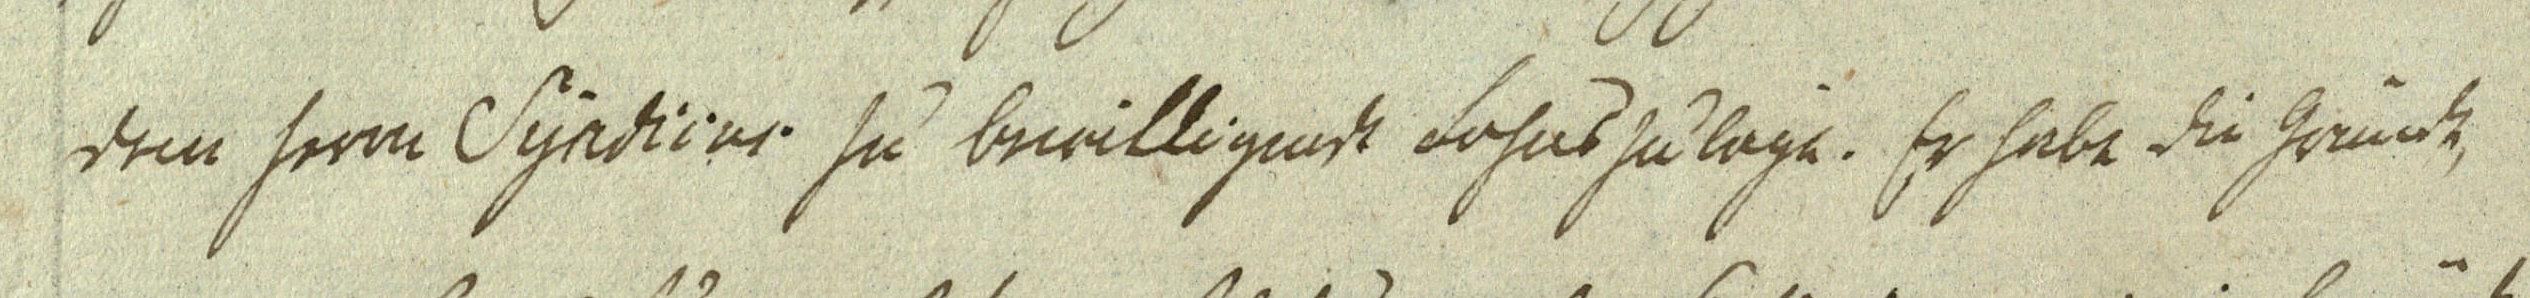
dem Herrn Sÿndicus zu bewilligende Lohnszulage. Er habe die Grund
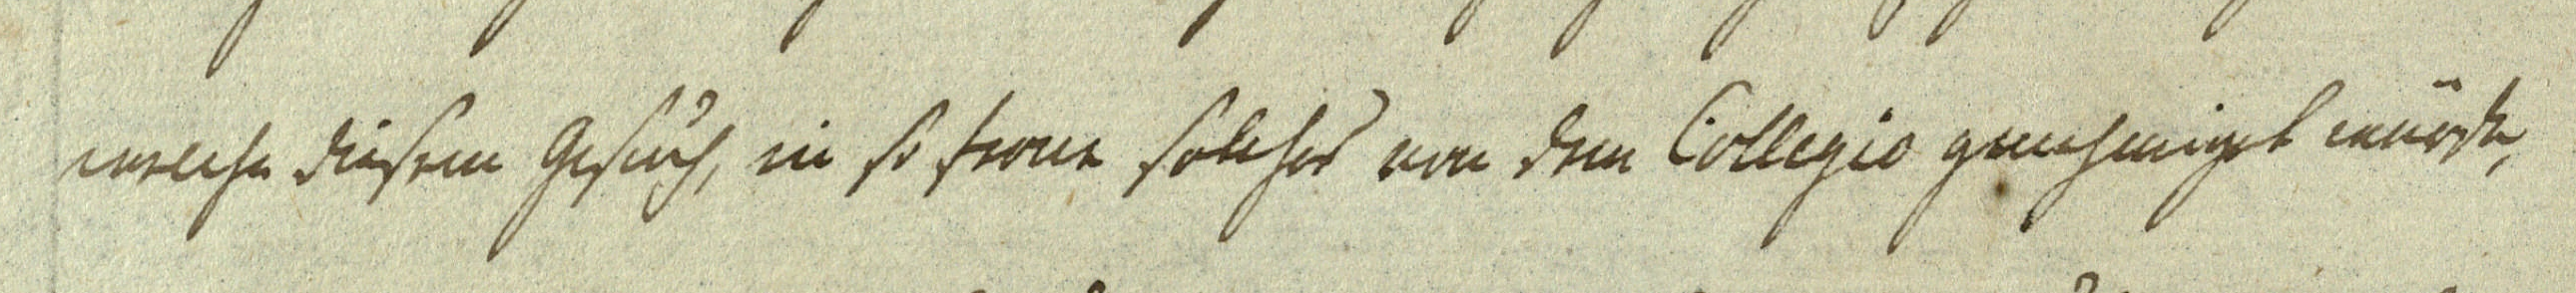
welche diesem Gesuch, in so ferne solches von dem Collegio genehmiget würde,
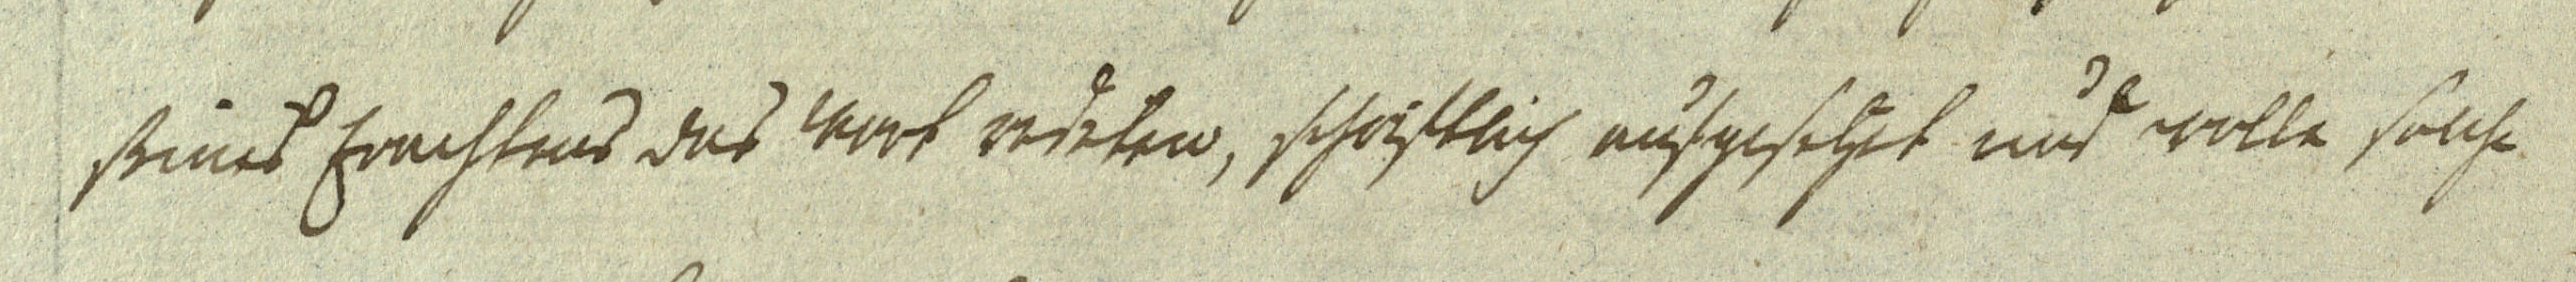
seines Erachtens das Wort redeten, schriftlich aufgesetzet und wolle solche
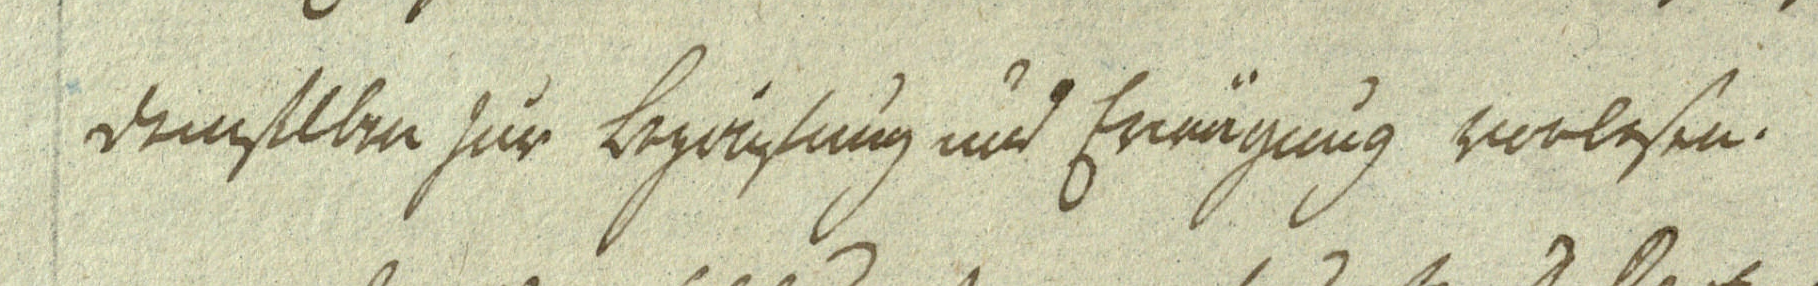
demselben zur Beprüfung und Erwägung vorlesen.
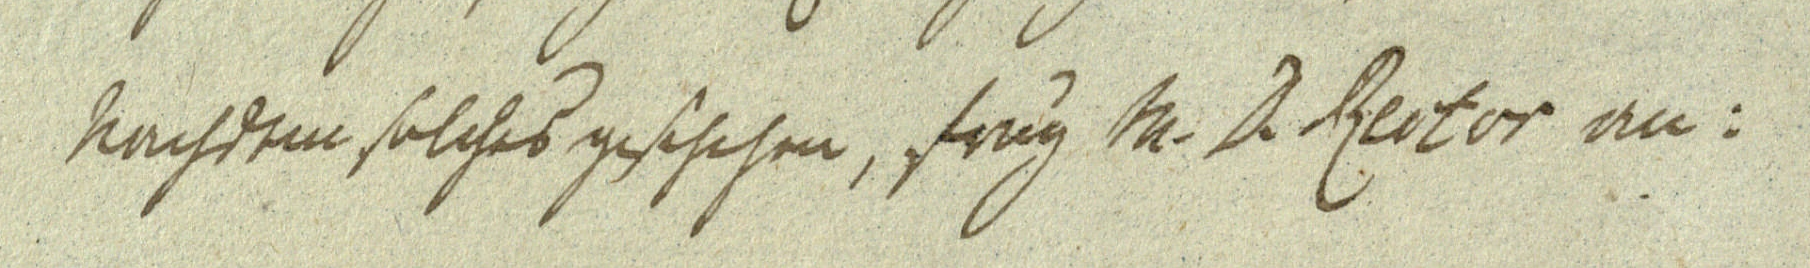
Nachdem solches geschehen, frug M. D. Rector an:
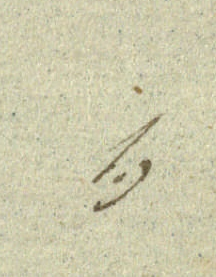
1.,
